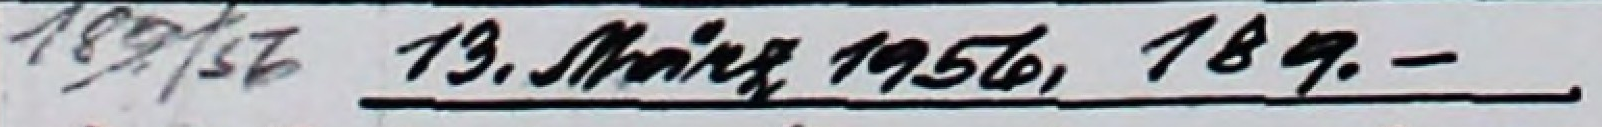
189/56 13. März 1956, 189.-
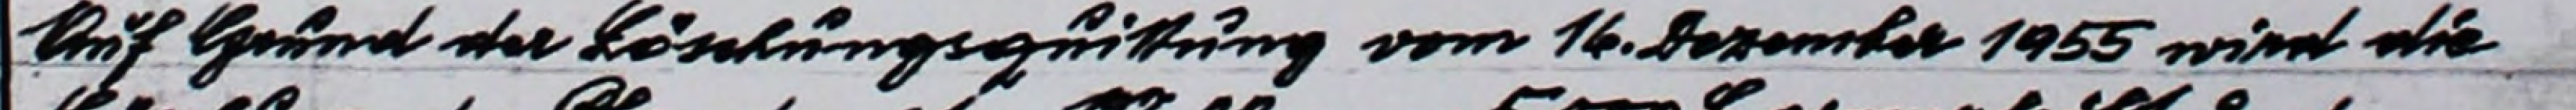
Auf Grund der Löschungsquittung vom 16. Dezember 1955 wird die
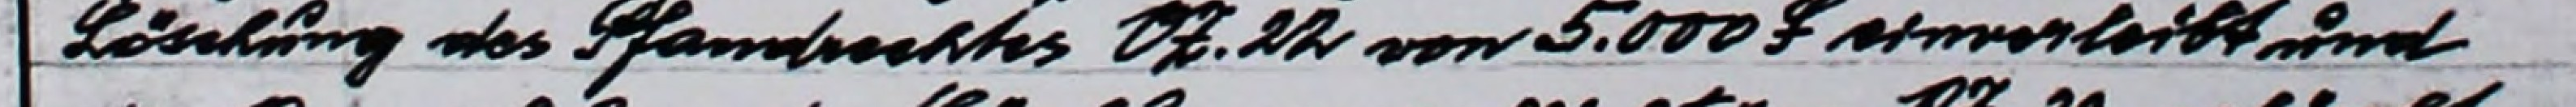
Löschung des Pfandrechtes OZ. 22 von 5.000 F einverleibt und
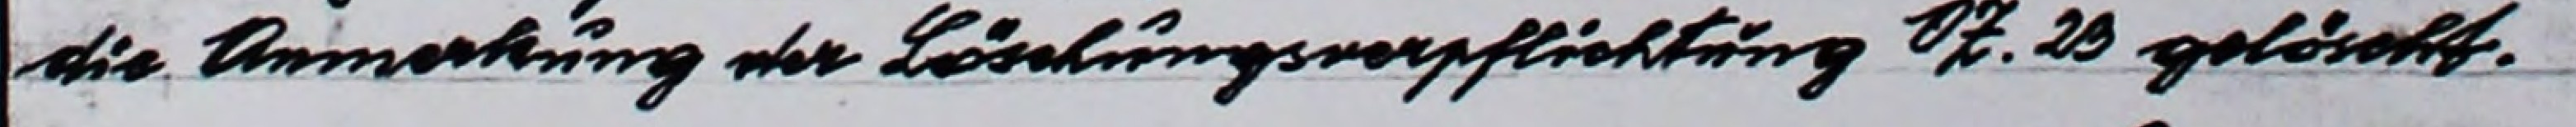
die Anmerkung der Löschungsverpflichtung OZ. 23 gelöscht.
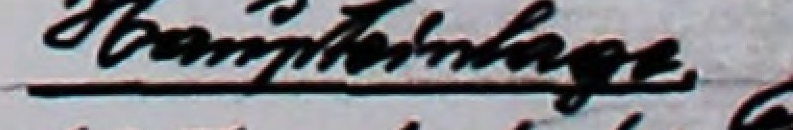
Haupteinlage.
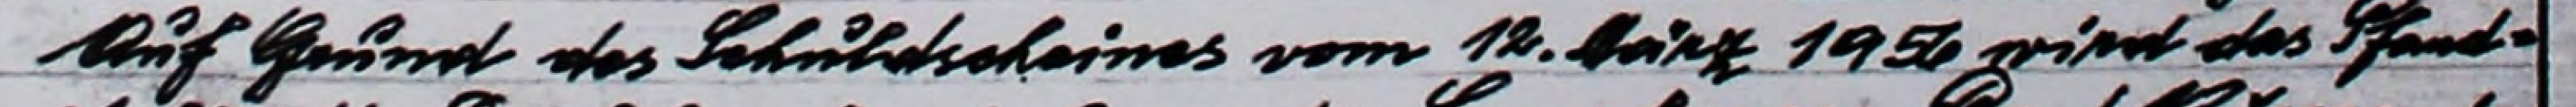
Auf Grund des Schuldscheines vom 12. März 1956 wird des Pfand=
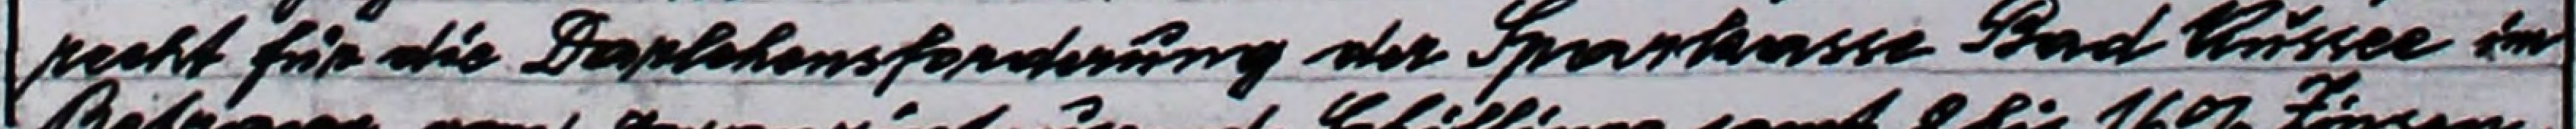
recht für die Darlehensforderung der Sparkasse Bad Aussee im
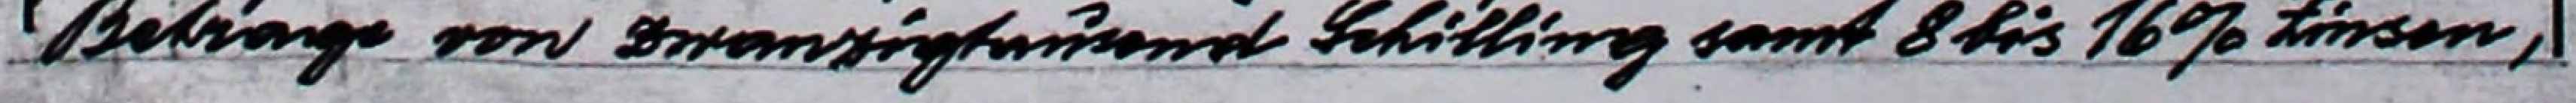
Betrage von Zwanzigtausend Schilling samt 8 bis 16 % Zinsen,
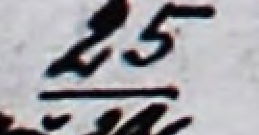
25
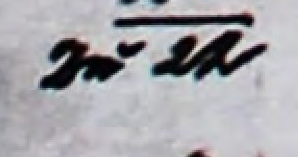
zu 22
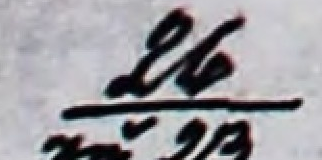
26
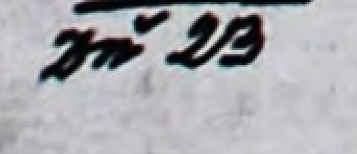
zu 23
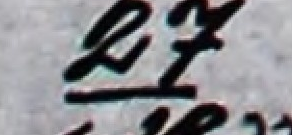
27
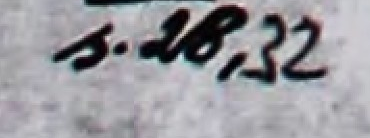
s. 28, 32
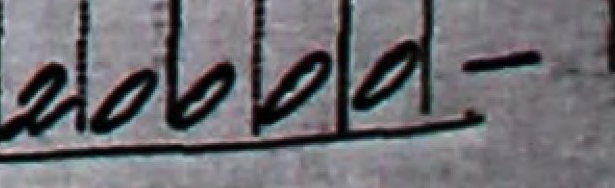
20000 –
